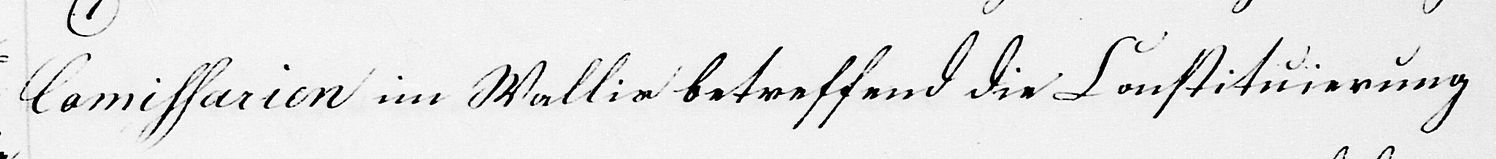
Comissarion im Wallis betreffend die Constituierung
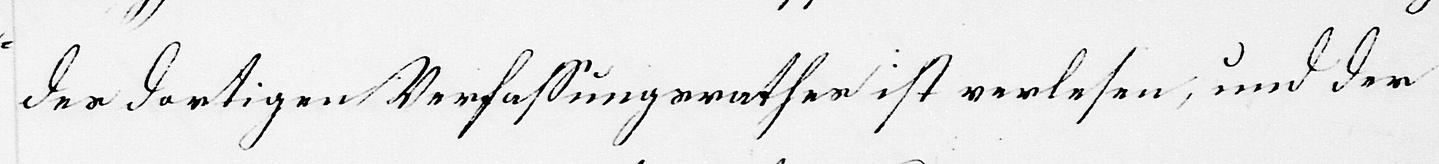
des dortigen Verfaßungsrathes ist verlesen, und der
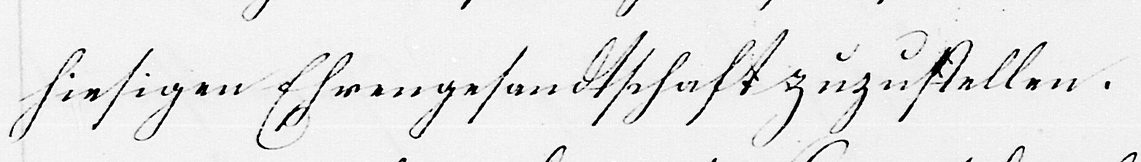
hiesigen Ehrengesandtschaft zuzustellen.
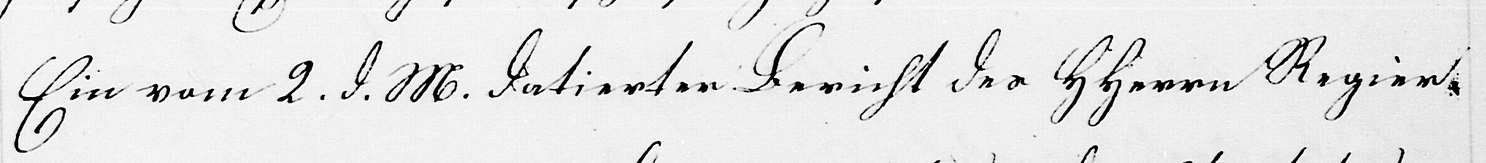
Ein vom 2. d. M. datierter Bericht des HHerrn Regier¬
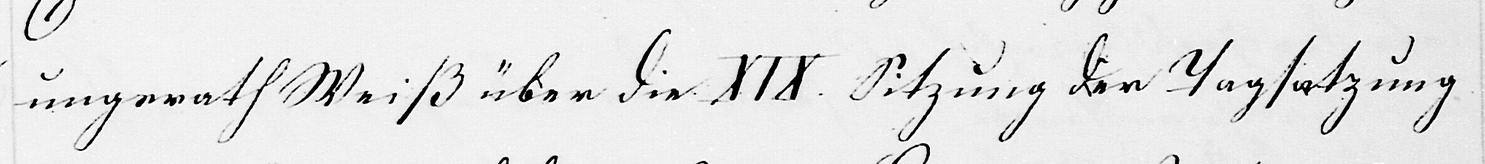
ungsrath Weiß über die XIX. Sitzung der Tagsatzung
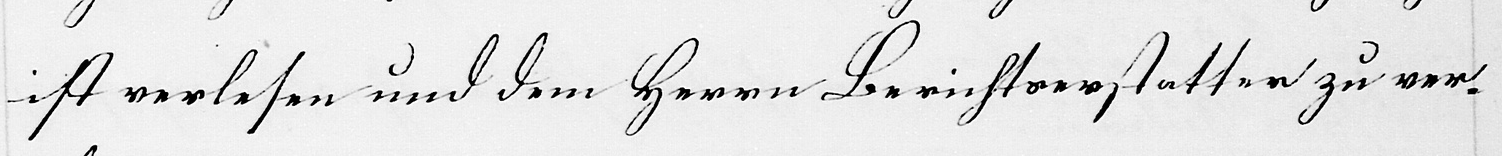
ist verlesen und dem Herrn Berichtserstatter zu ver¬
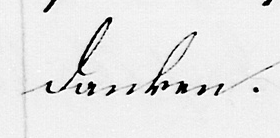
danken.
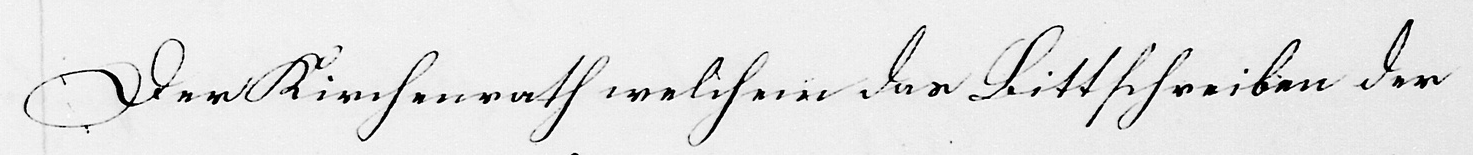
Der Kirchenrath welchem das Bittschreiben der
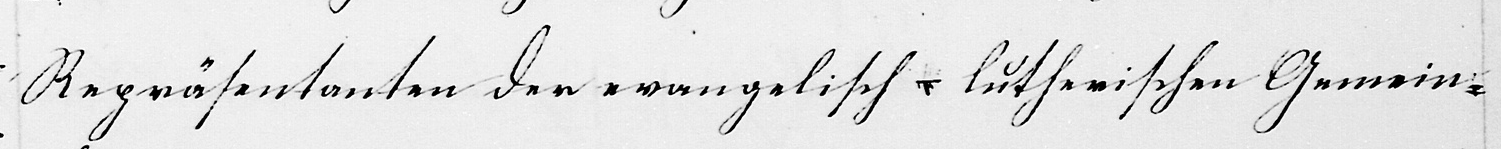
Repräsentanten der evangelisch-lutherischen Gemein¬
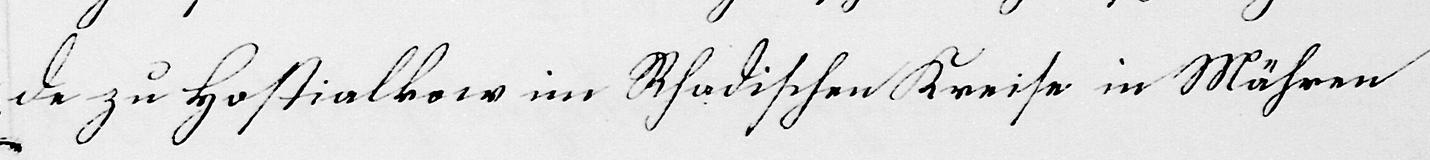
de zu Hostialkow im Rhadischen Kreise in Mähren
